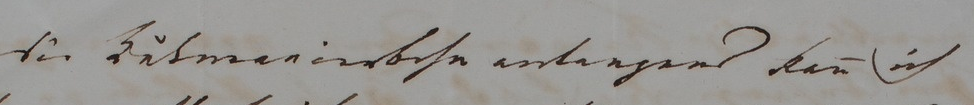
Die Lukmanierbahn anlangend kann ich
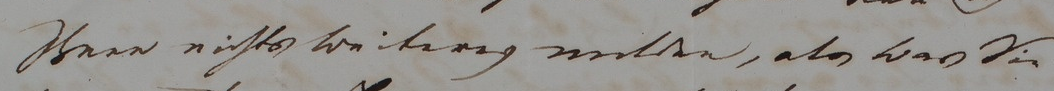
Ihnen nichts Weiteres melden, als was Sie
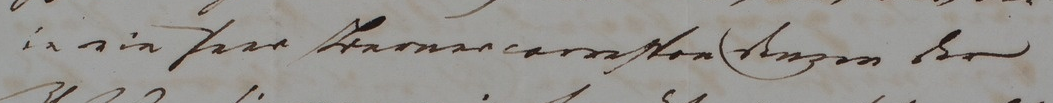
in ein paar Bernercorrespondenzen der
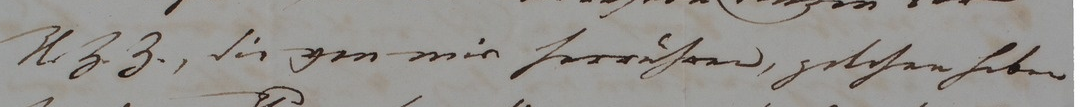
N.Z.Z., die von mir herrühren, gelesen haben
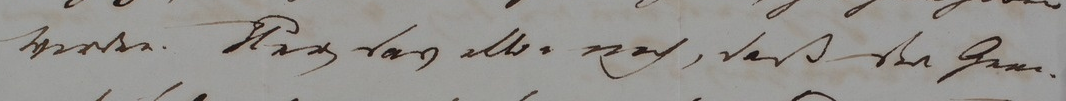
werden. Nur das etwa noch, daß der Gene-
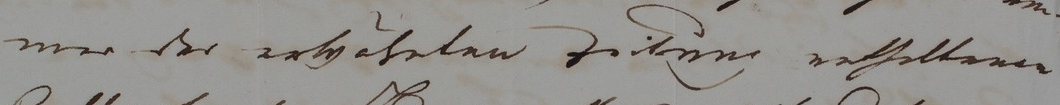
mer der erwähnten Zeitung enthaltenen
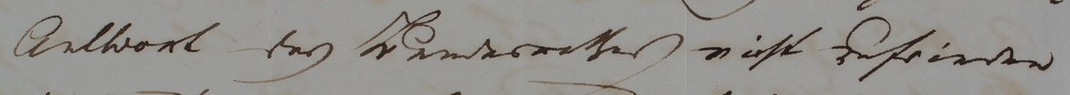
Antwort des Bundesrathes nicht zufrieden
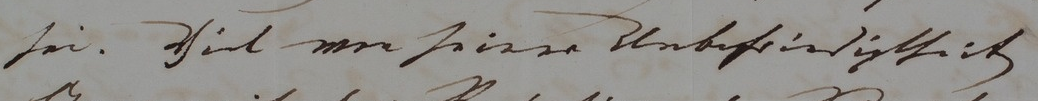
sei. Viel von seiner Unbefriedigtheit
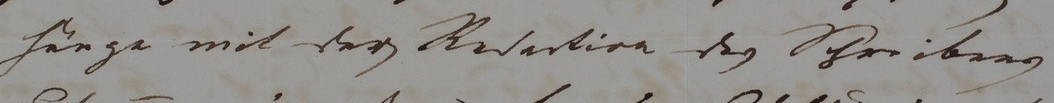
hänge mit der Redaction des Schreibens
